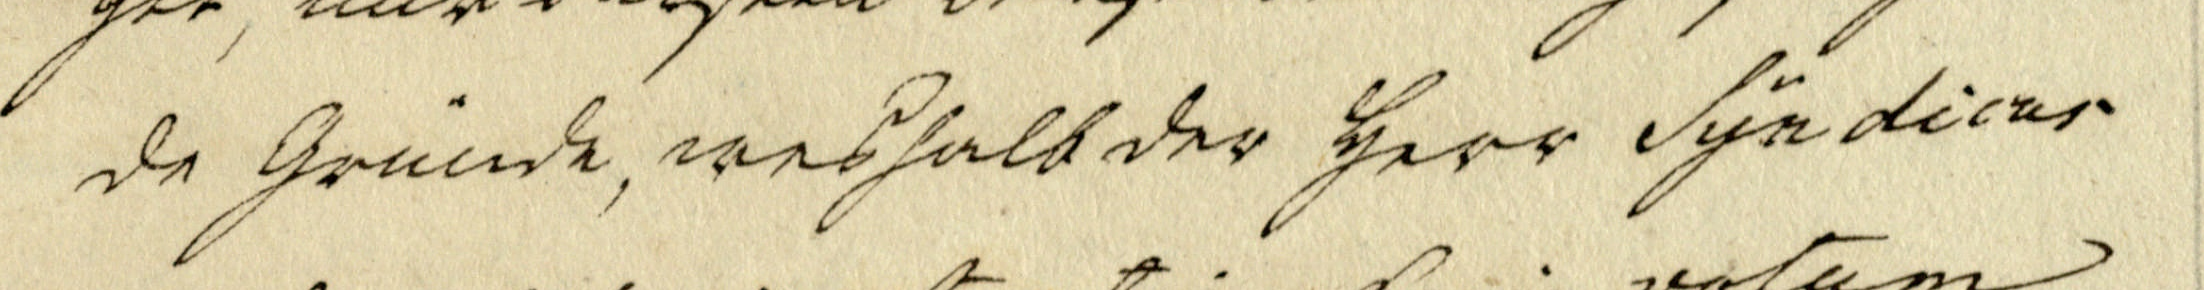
de Gründe, weshalb der Herr Sÿndicus
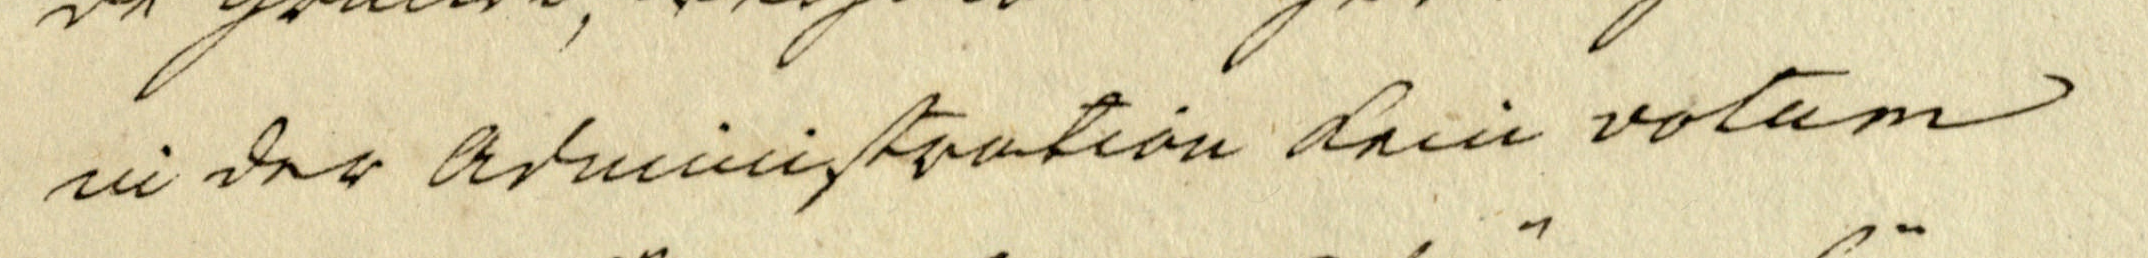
in der Administration kein votum
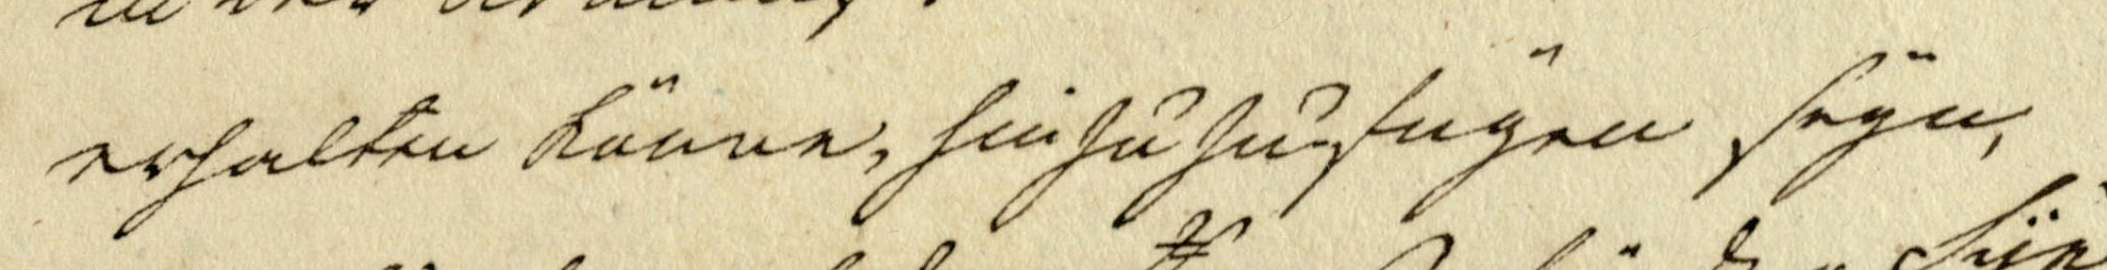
erhalten könne, hinzuzufügen seÿn,
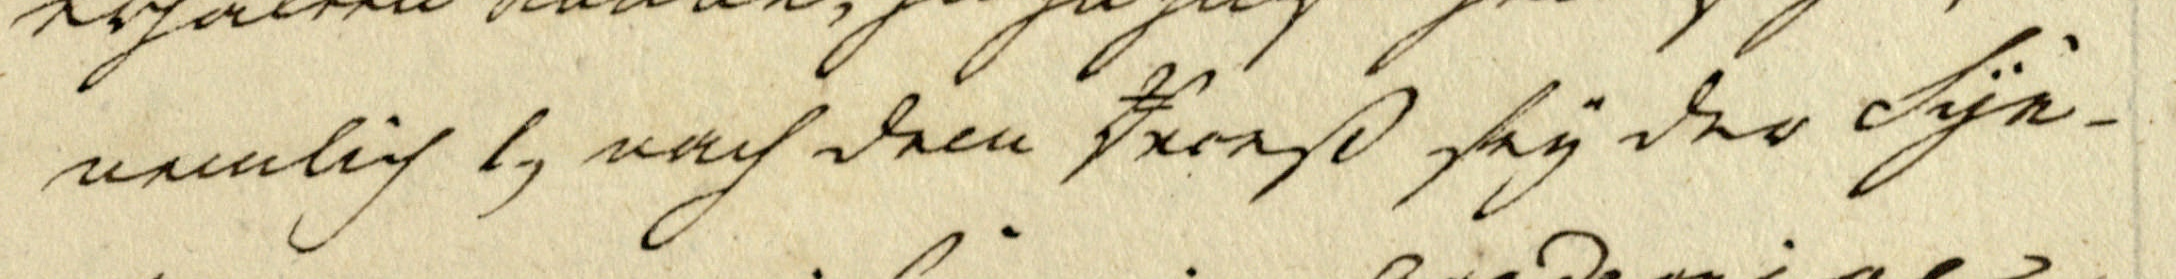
nemlich 1., nach dem Receß seÿ der Sÿn¬
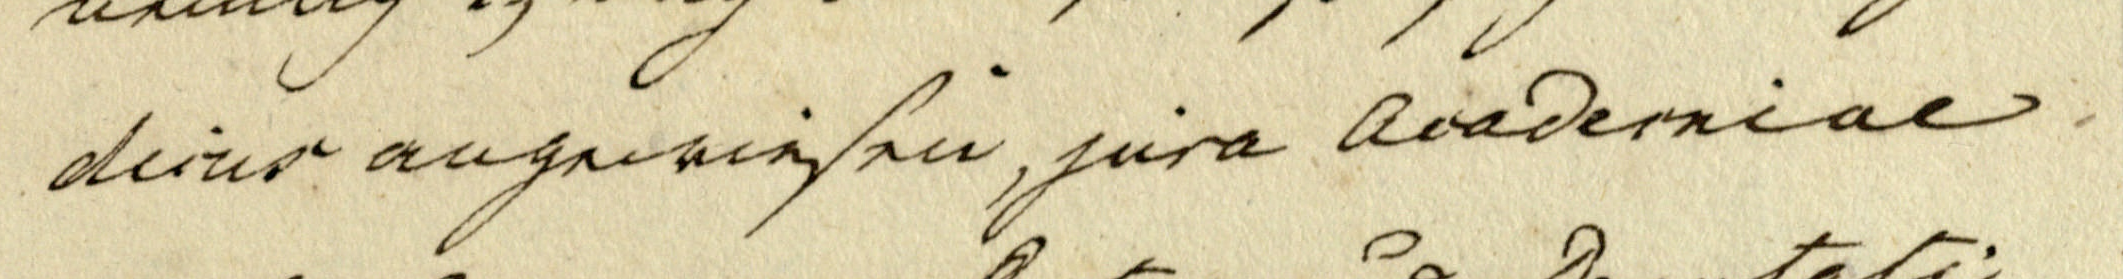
dicus angewiesen, jura Academiae
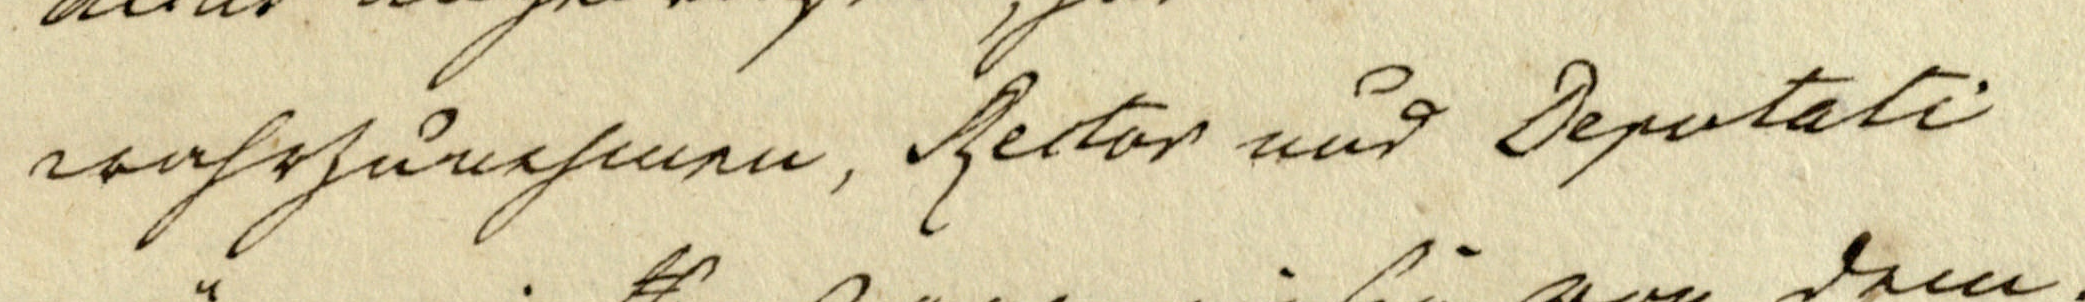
wahrzunehmen, Rector und Deputati
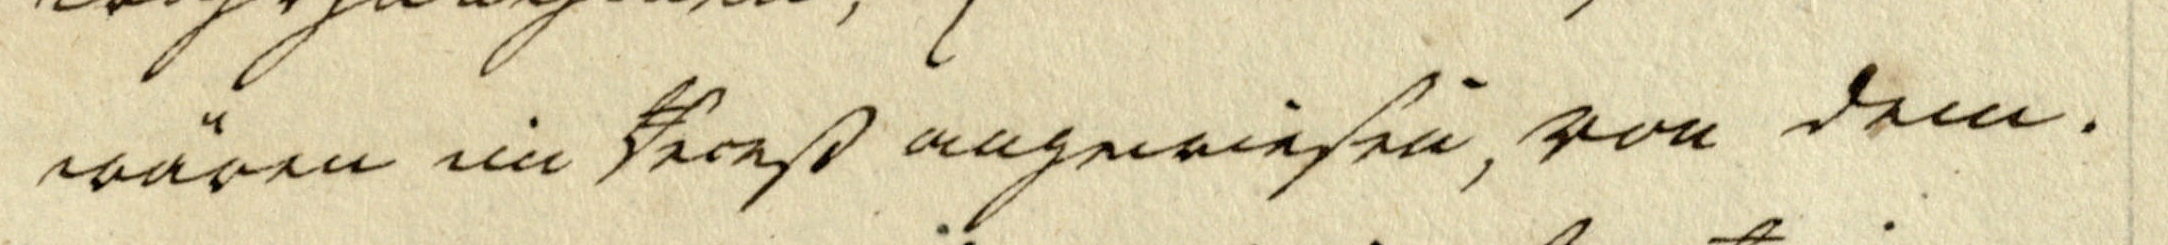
wären im Receß angewiesen, von dem¬
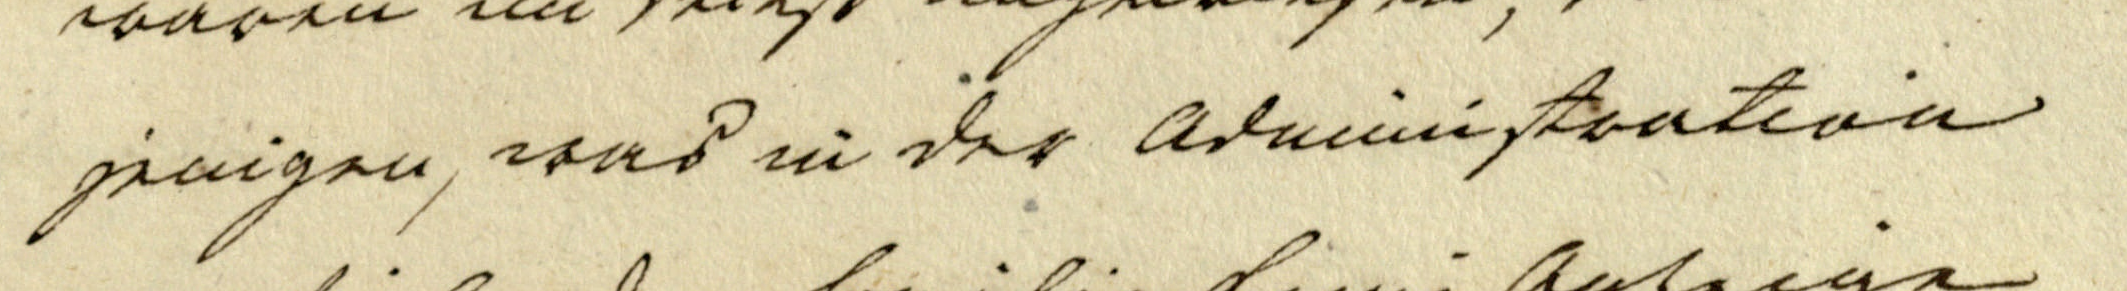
jenigen, was in der Administration
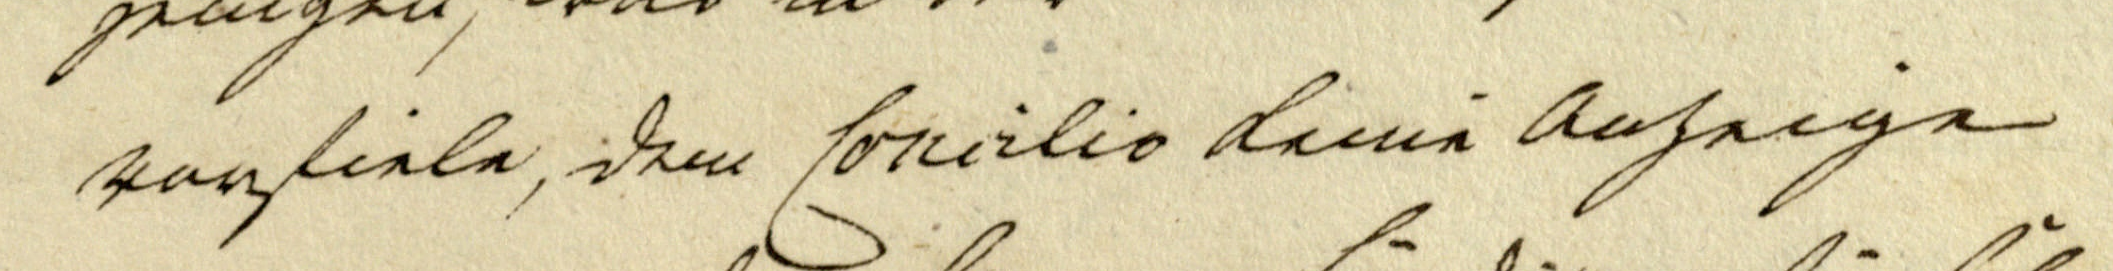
vorfiele, dem Concilio keine Anzeige
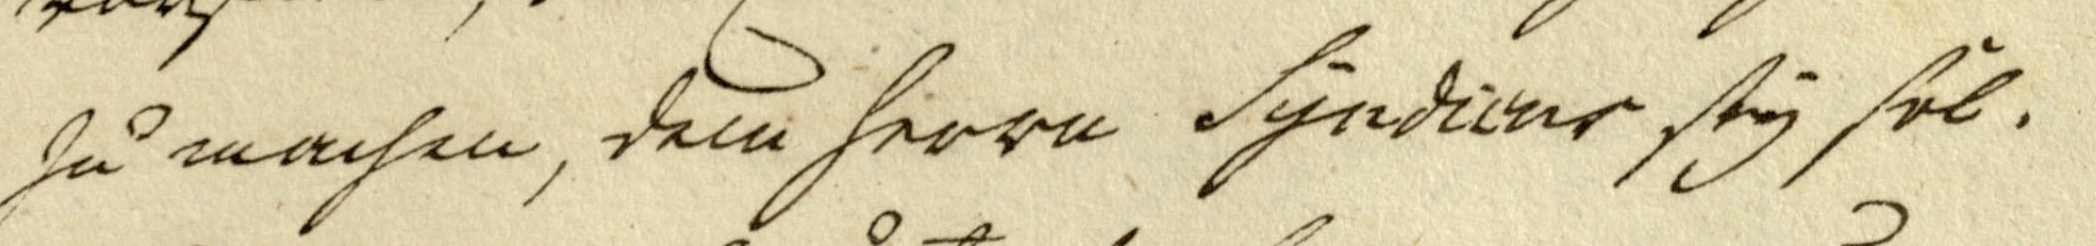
zu machen, dem Herrn Sÿndicus seÿ sol¬
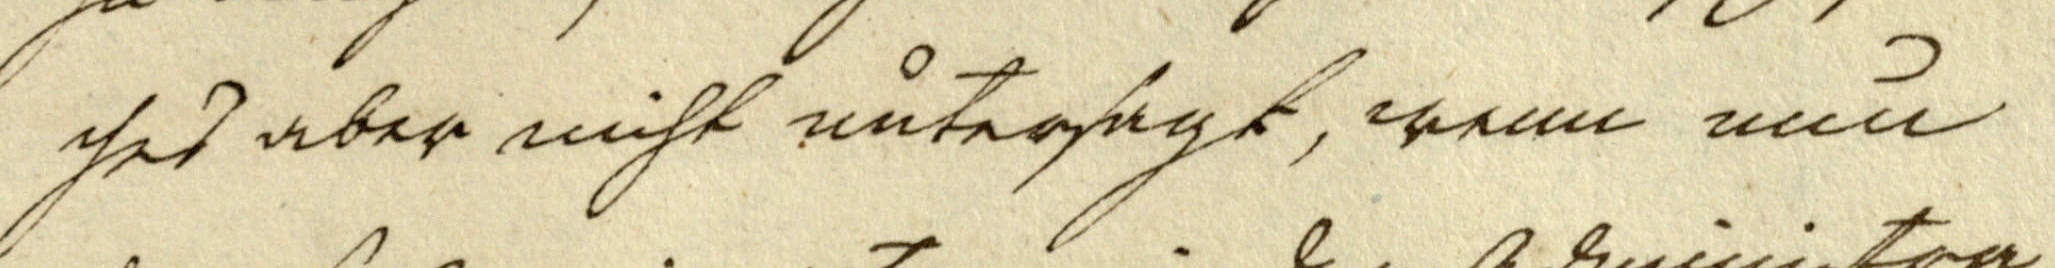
ches aber nicht untersagt, wenn nun
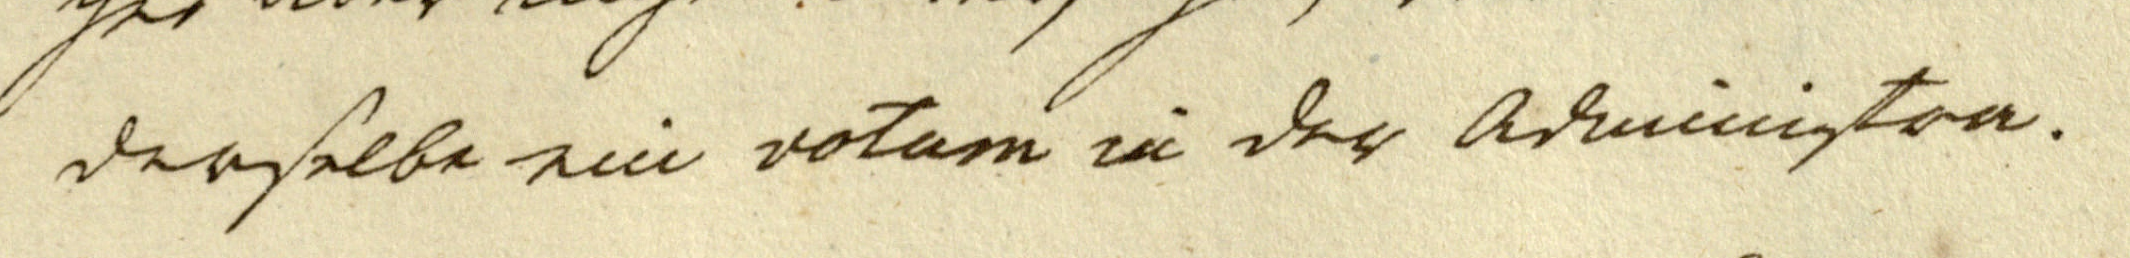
derselbe ein votum in der Administra¬
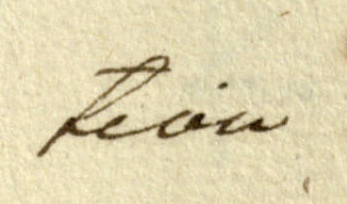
tion
